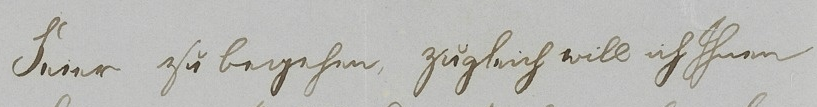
Feier zu begehen, zugleich will ich Ihnen
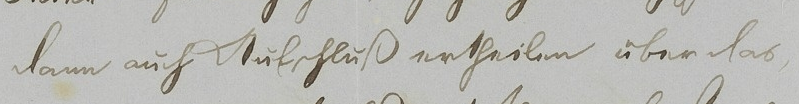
dann auch Aufschluß ertheilen über das,
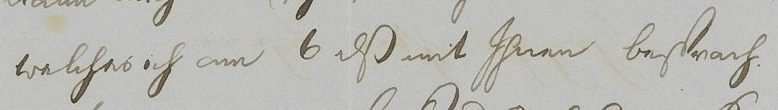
welches ich am 6dß mit Ihnen besprach.
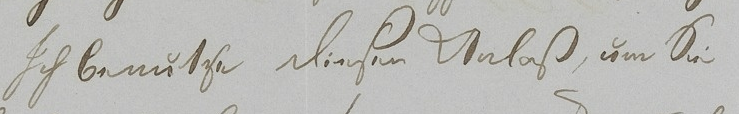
Ich benutze diesen Anlaß, um Sie
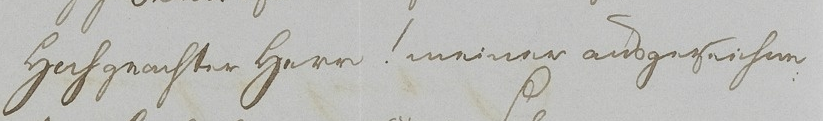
Hochgeachter Herr! meiner ausgezeichne-
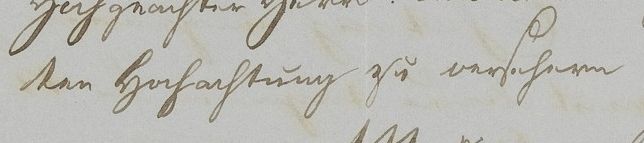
ten Hochachtung zu versichern
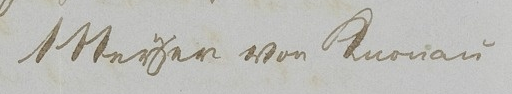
Meyer von Knonau
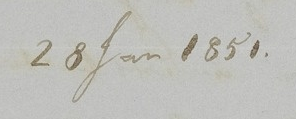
28 Jan 1851.
